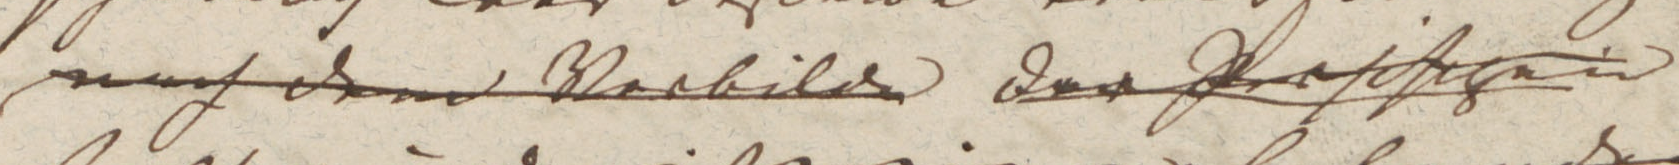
nach dem Vorbilde der Persischen
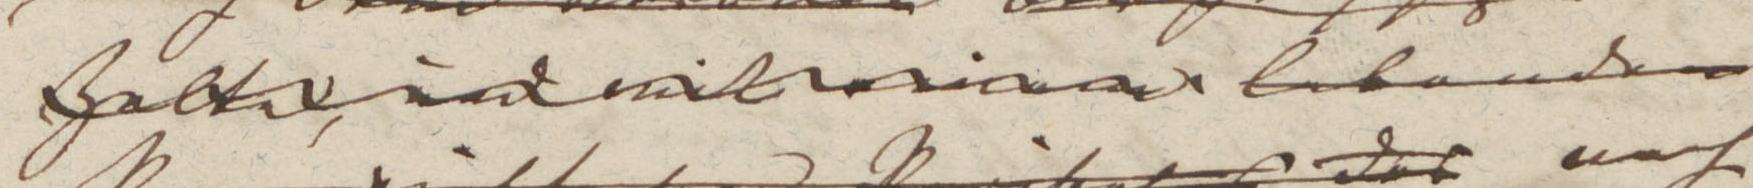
Zelte, und mit einem lebenden
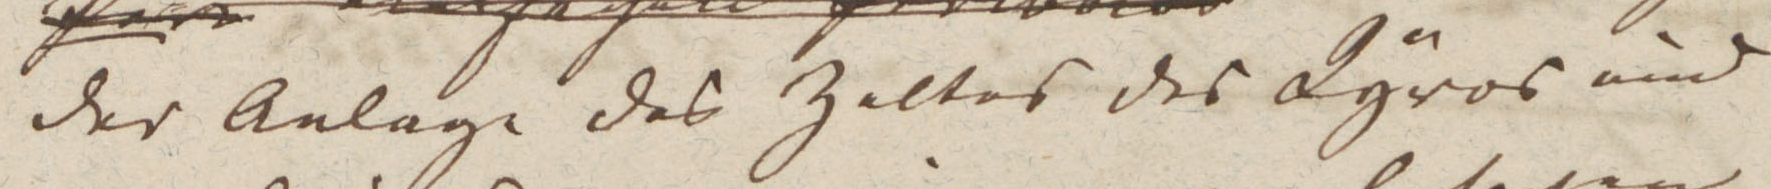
der Anlage des Zeltes des Kyros und
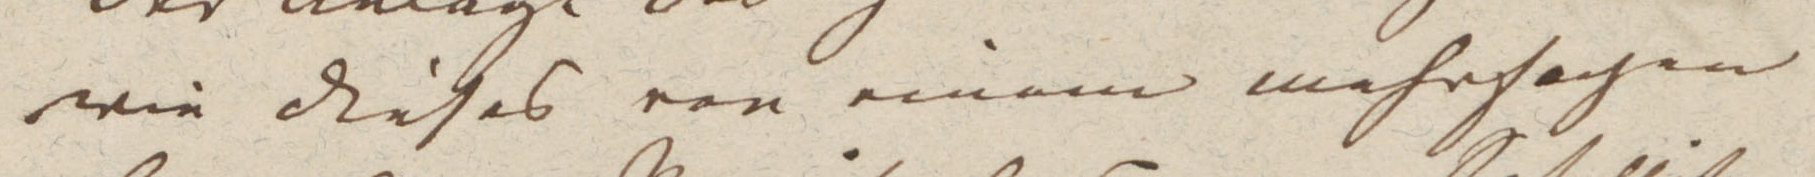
wie dieses von reinem mehrfachen
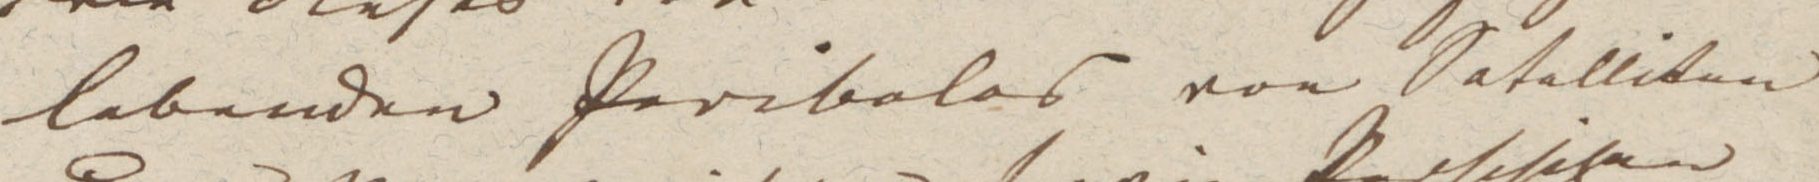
lebenden Peribolos von Satelliten
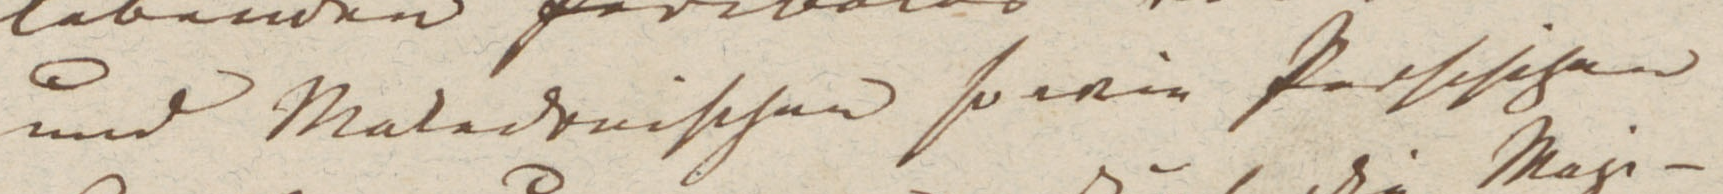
und Makedonischen so wie Persischen
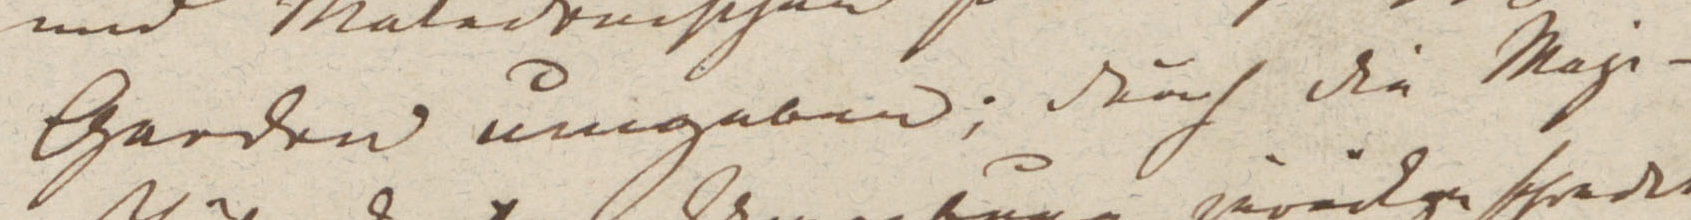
Garden umgeben; Durch die Maje-
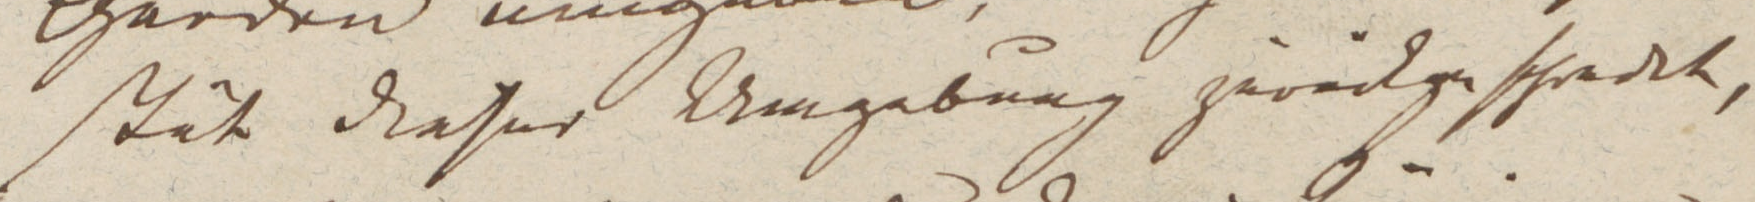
stät dieser Umgebung zurückgeschreckt,
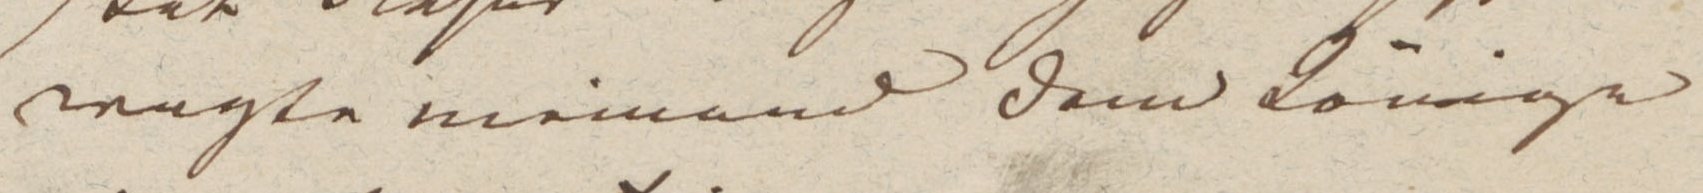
wagte niemand dem Könige
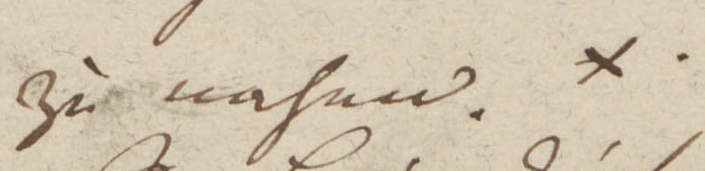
zu nahen. %
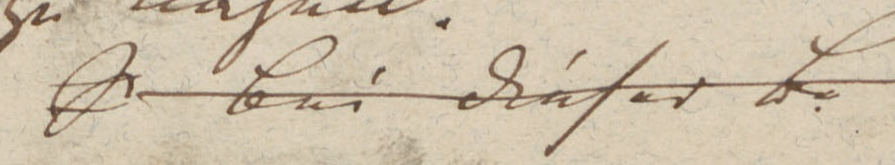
S Bei dieser B
